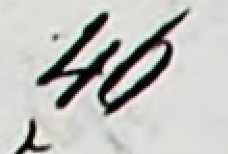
46
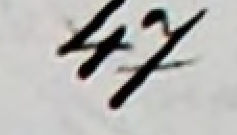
47
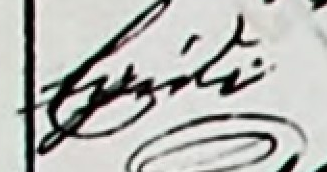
Epidi
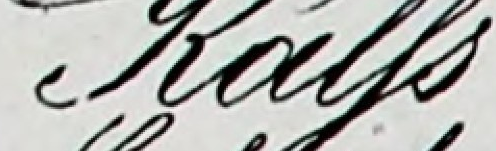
Kalss
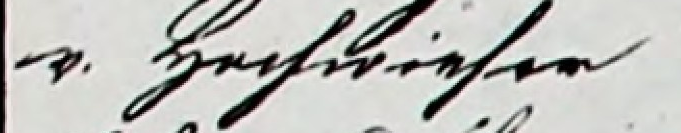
v. Hochwieser
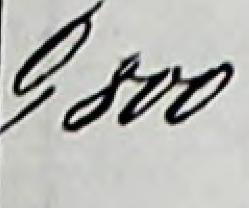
0,800
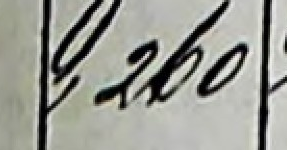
0,260
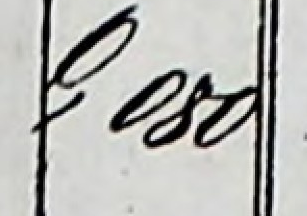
0,080
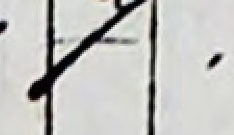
7
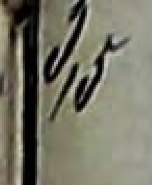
5,5
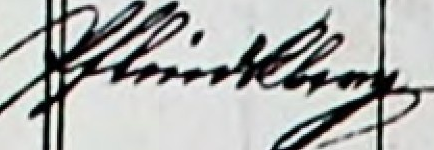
Pflindsberg
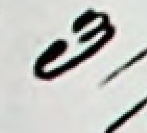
3
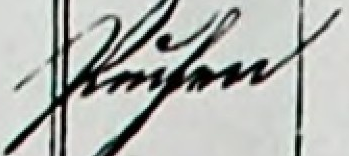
Puchen
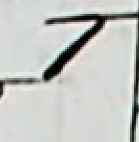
I
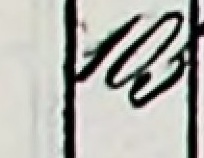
105
